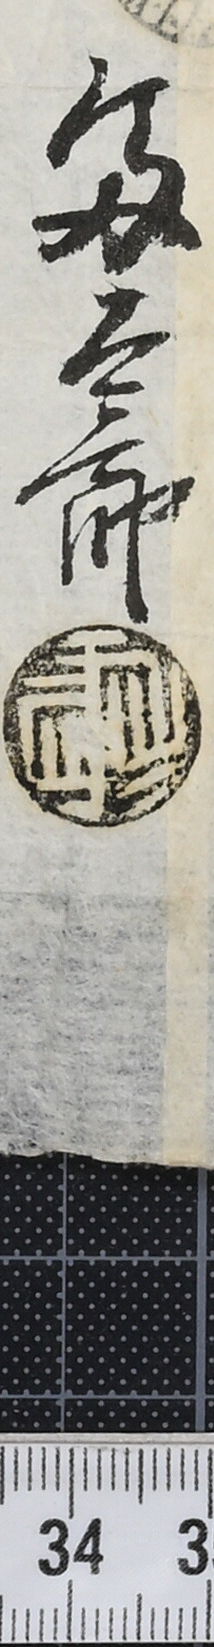光太郎㊞
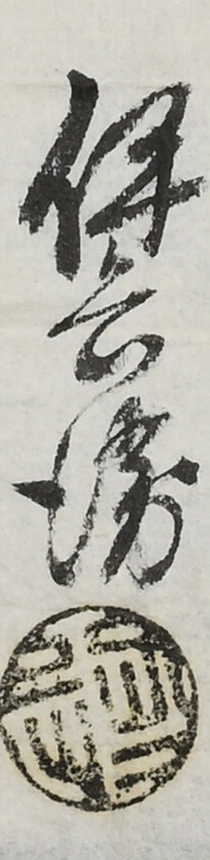伊兵衛㊞
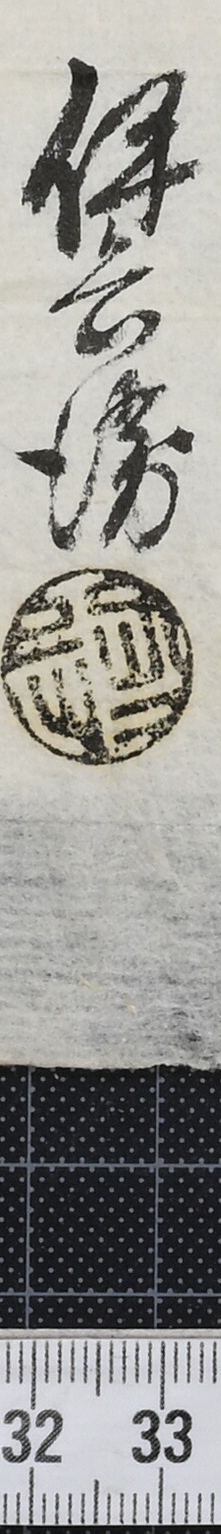伊兵衛㊞
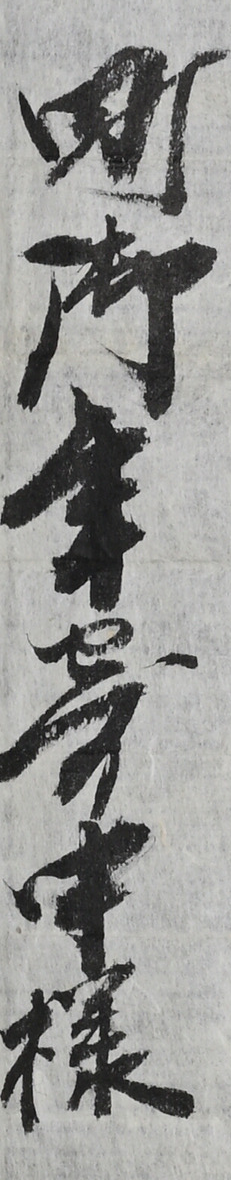町御年寄中様

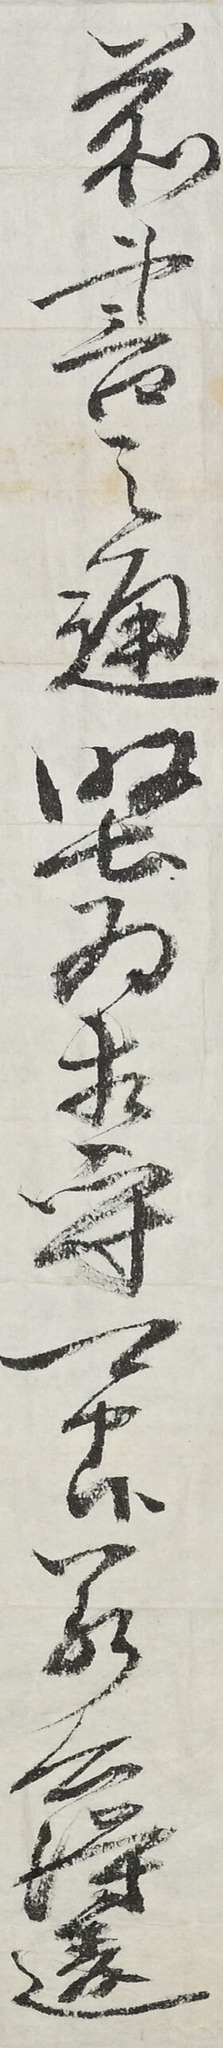前書之通堅為相守可申候若心得違
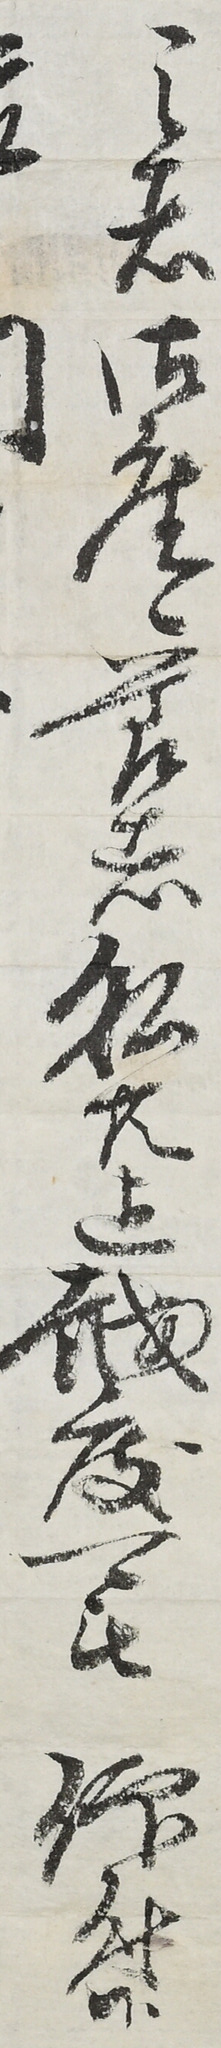之者御座候節者私共迄越度可被仰付候
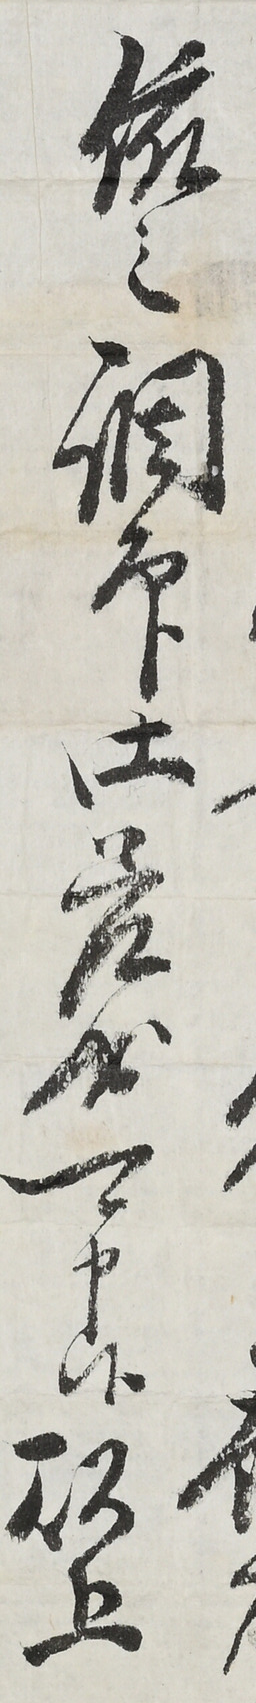依之調印仕差出可申候以上
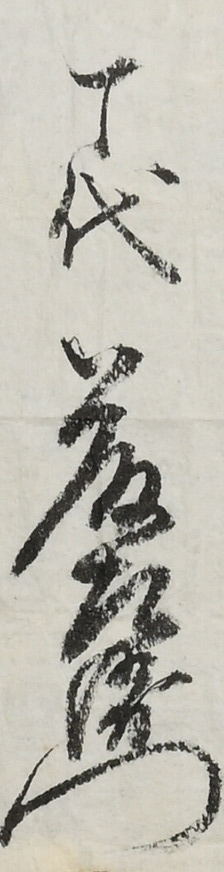丁代藤左衛門㊞

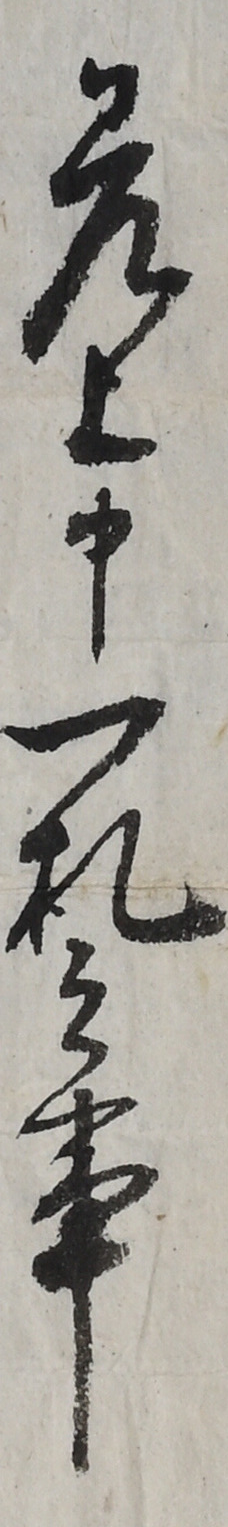差上申一札之事
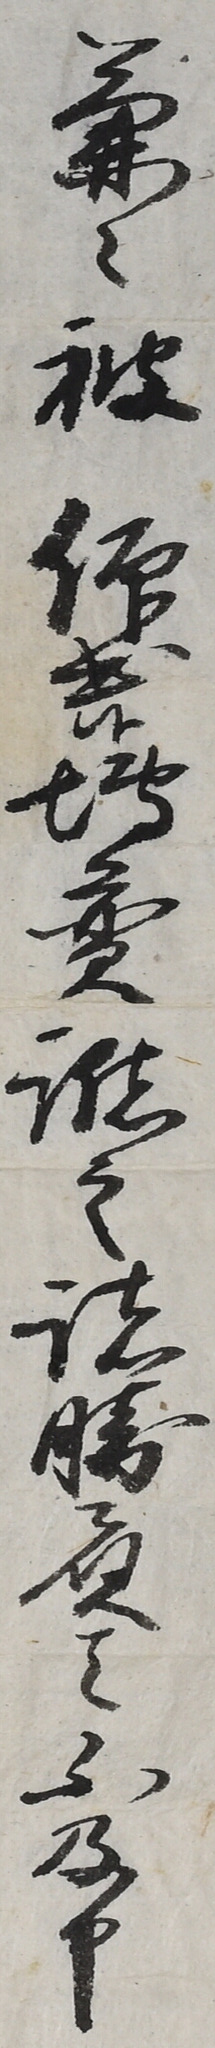兼々被仰出候博奕賭之諸勝負者不及ぶ申
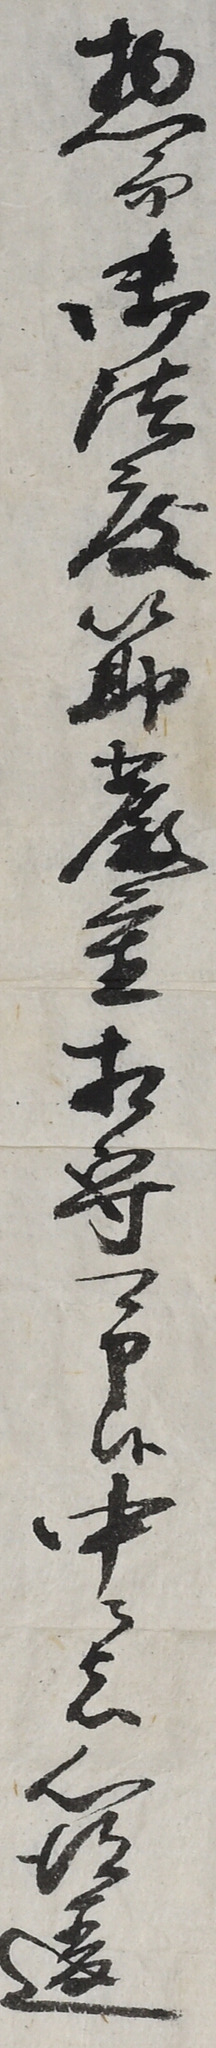惣而御法度筋厳重相守可申候中ニ者心得違
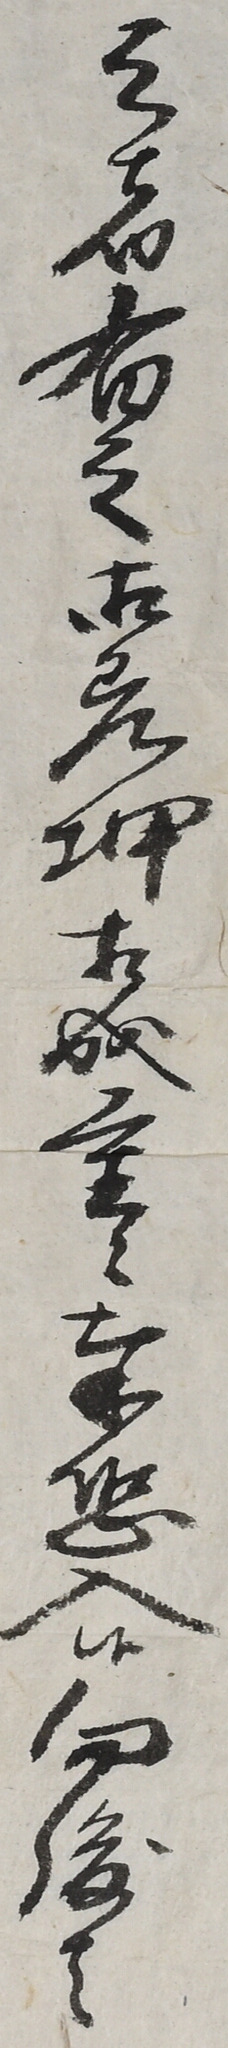之者有之御差押相成重々奉恐入候向後者
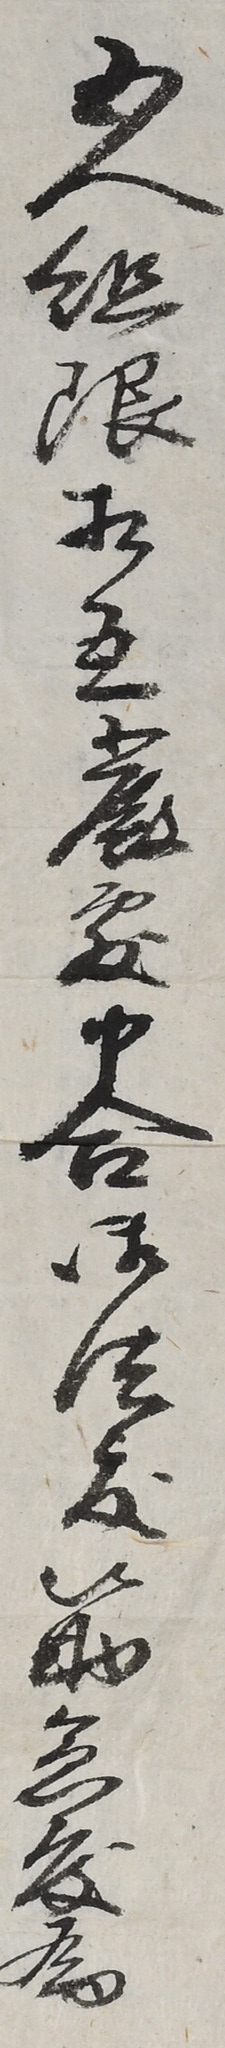五人組限相互厳敷申合御法度筋急度為
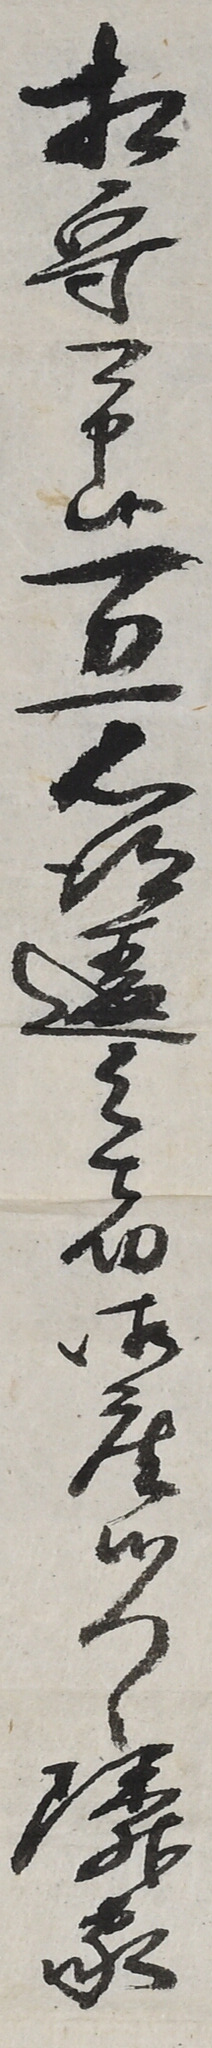相守可申候万一心得違之者御座候ハゝ隣家
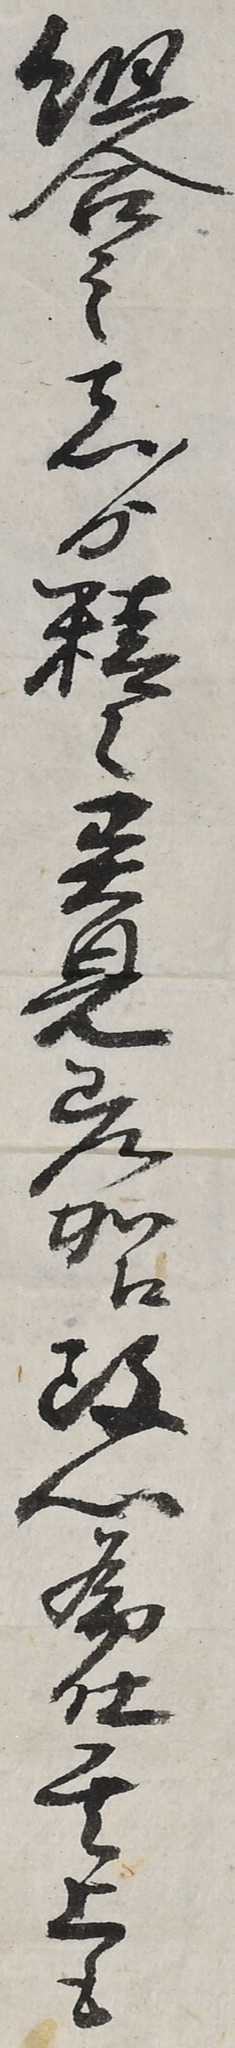組合之者ゟ精々異見差加江改心為仕其上も
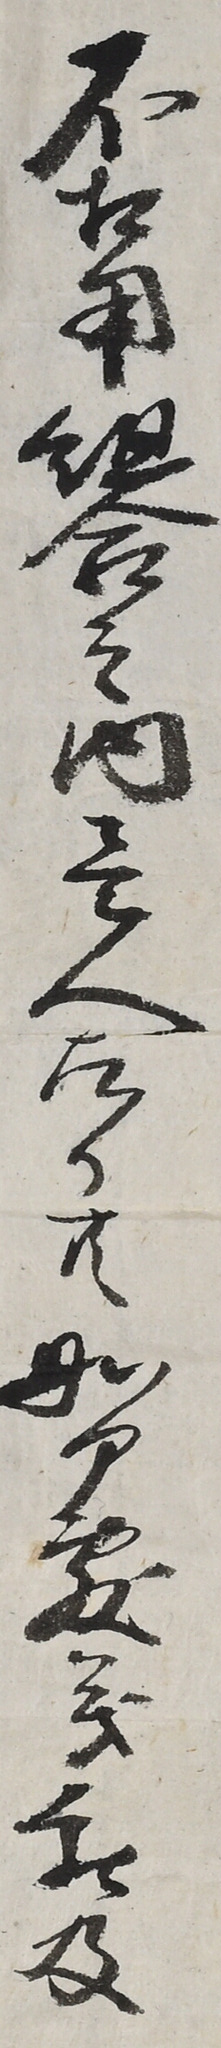不相用組合之内壱人たり共如何敷義被及
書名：差上申一札之事
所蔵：伊那市立高遠町図書館・合同会社AMANE
